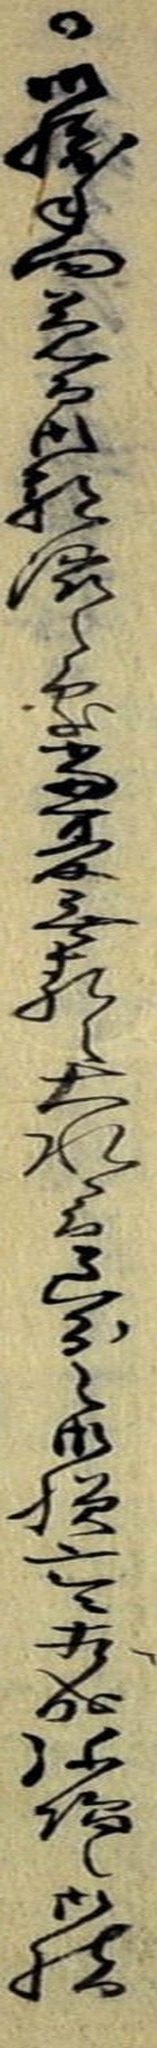〇御勝手向兼而御難渋之処当夏無類之大出水ニ而御損亡ニ相成弥増之御指
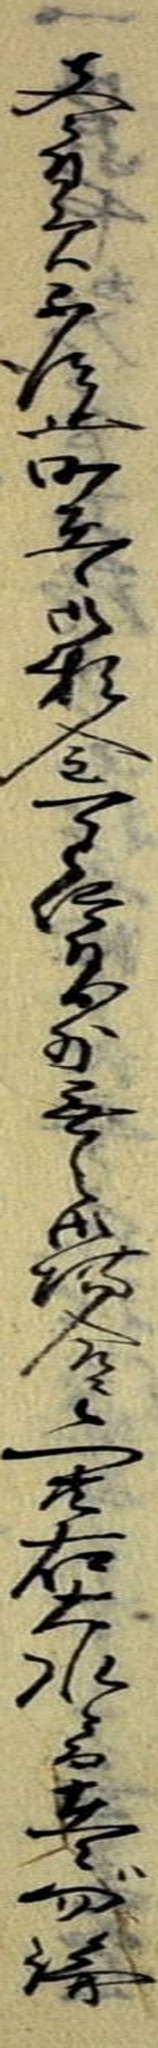支ニ付而ハ不得止町在へ御頼金可被仰付ゟ外無之御場合ニ候へ共右大水ニ而在々ハ勿論
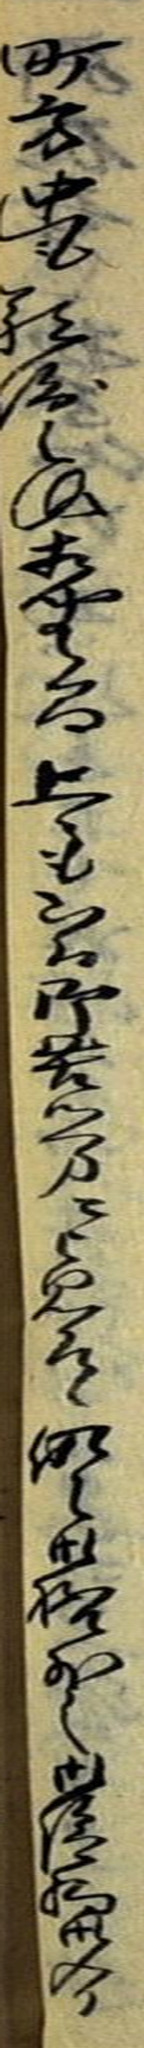町方迚も難儀之趣相聞候間上ニも至而御苦労ニ被思召候仍之御格外之御倹約御〆り
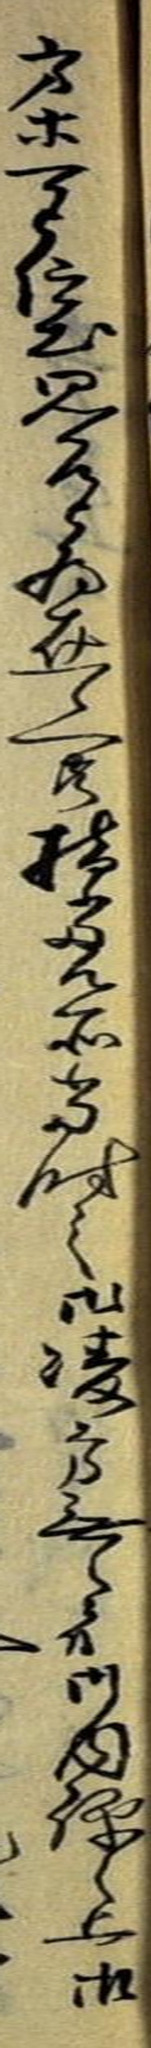方等可被仰出思召被為在候へ共指当ル所当時之御凌方無之ニ付御内評之上御
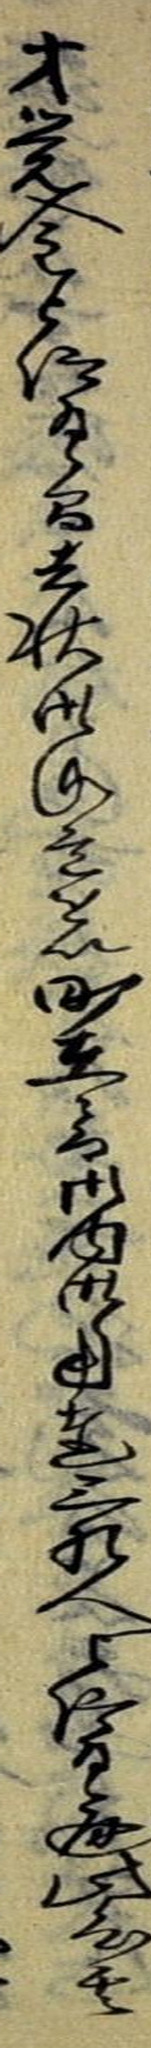御才覚金被仰付候間去秋御趣意を以町在ニ而御内御用達三拾人被仰付候通此度其
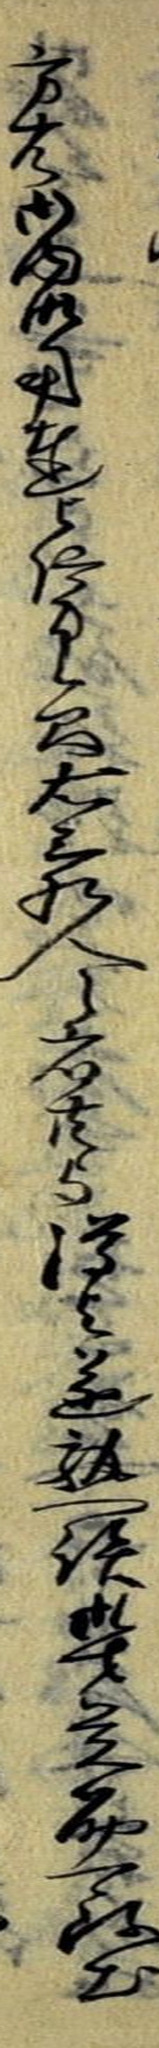方共御内御用達被仰付候間右三拾人之者共与得与遂熟談御才覚筋可致出
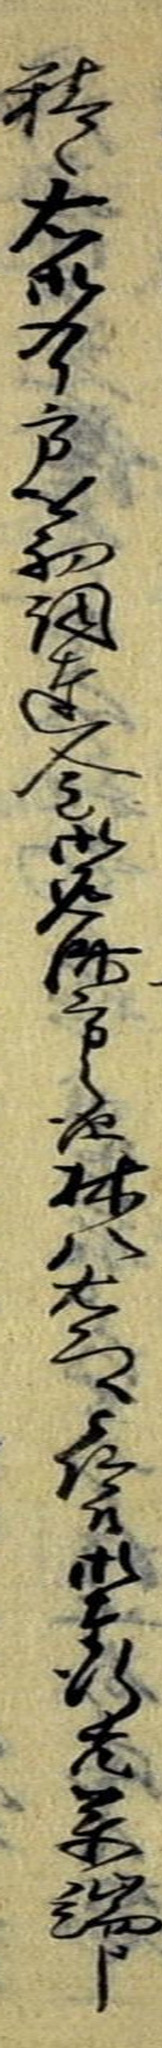精候右御〆り方を初調達金御返済方之儀林八右衛門へ被仰付御奉行共万端申
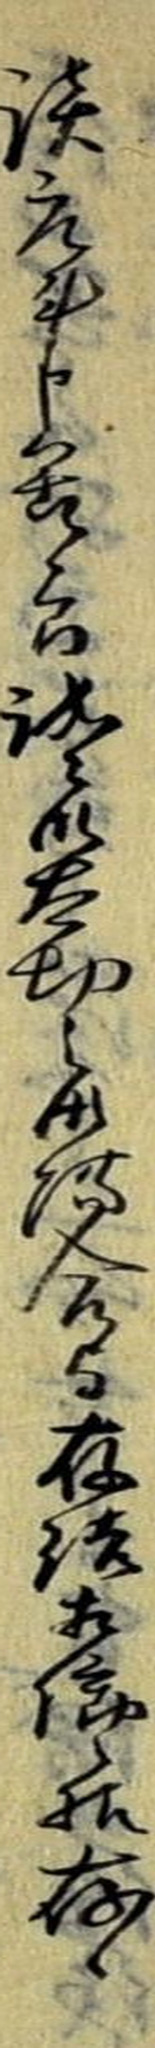談取計申筈候間誠ニ御太切之御場合与存諸相働候様存候
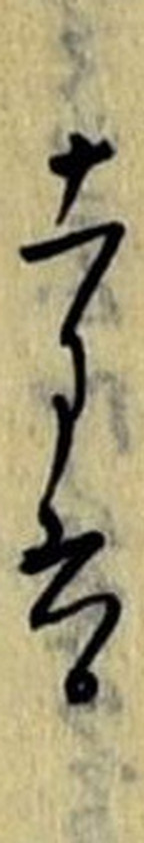十一月六日
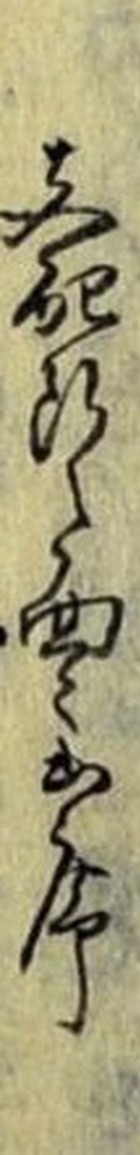支配頭之面々出席
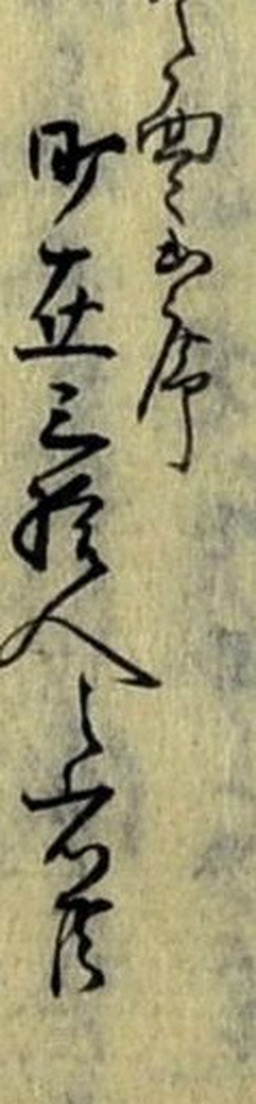町在三拾人之者共
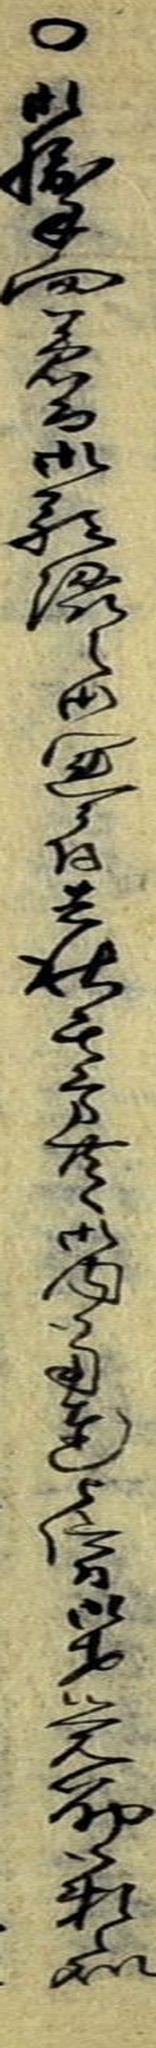〇御勝手向兼而御難渋之御運ニ付去秋其方共へ御内御用達被仰付御才覚筋御頼候処
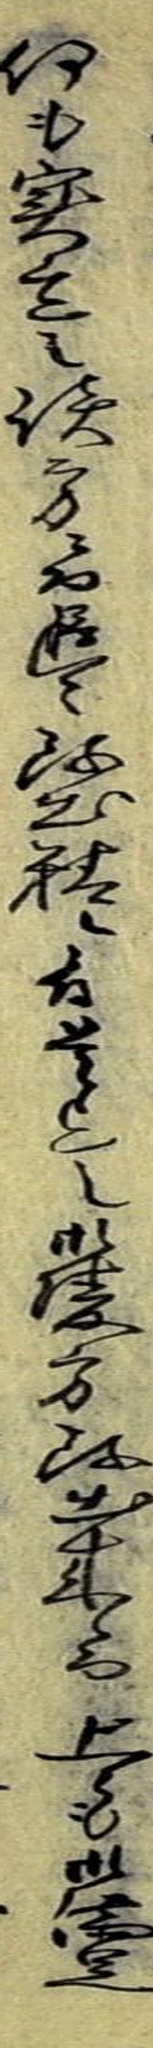何も実正之談方ニ而追々致出精候ニ付是迄之御凌方致出来候而上ニも御満足
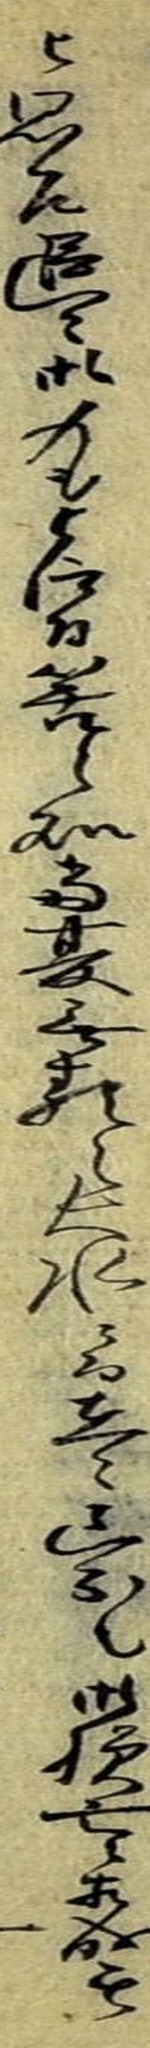被思召追々御〆りも被仰付筈之処当夏無類之大水ニ而在々過分之御損亡ニ相成其
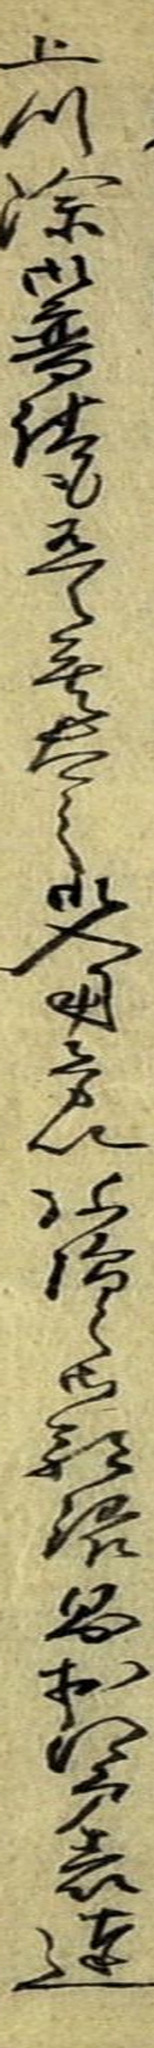上川除御普請も有之莫太之御入用旁以弥増之御難渋則於江戸表達
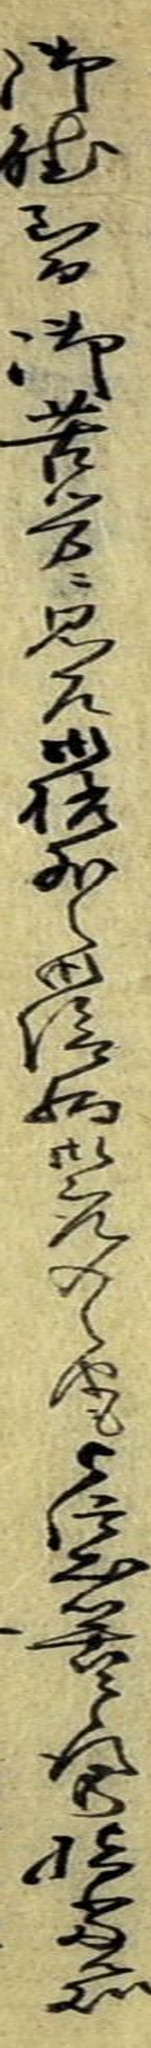御聴至而御苦労ニ思召御格外之御倹約御取〆之儀も被仰出筈ニ候得共指当ル処
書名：命令之部 三
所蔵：福井県文書館 Fukui Prefectural Archives
